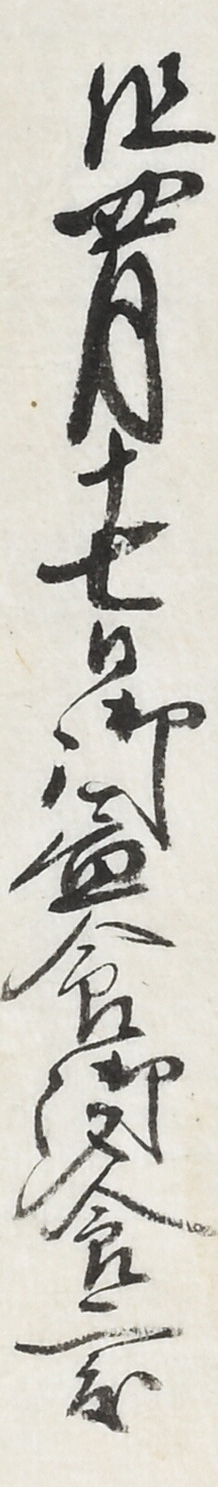但四月十七日御昼食御夕食二度

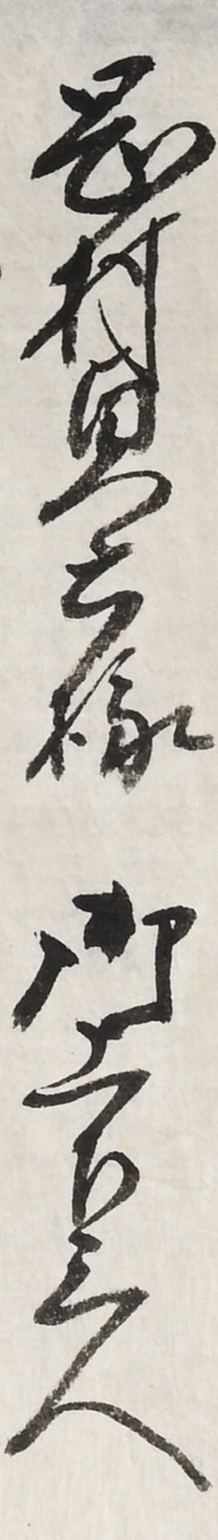岡村貞六様御上下三人
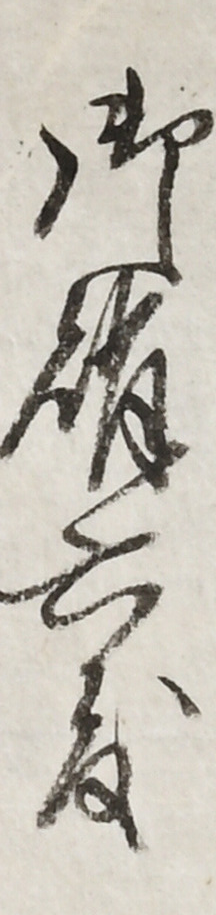御賄六度
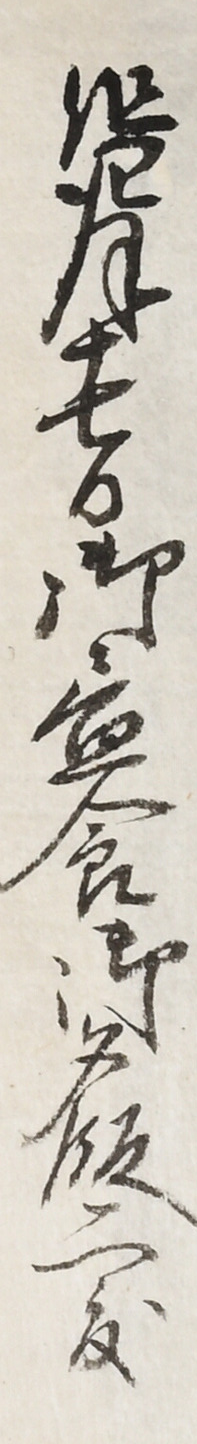但四月十七日御昼食御夕飯二度
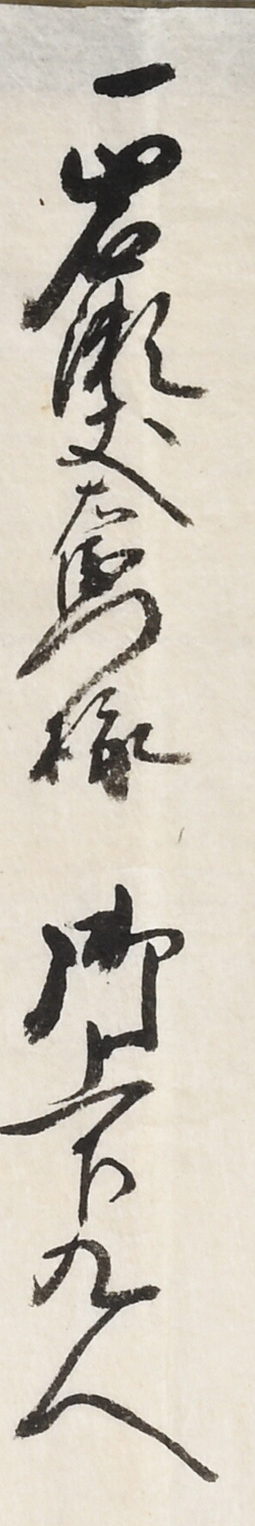一岩瀬丈右衛門様御上下九人
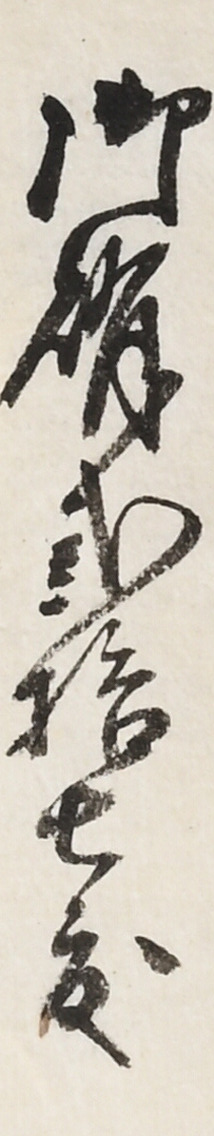御賄弐拾七度
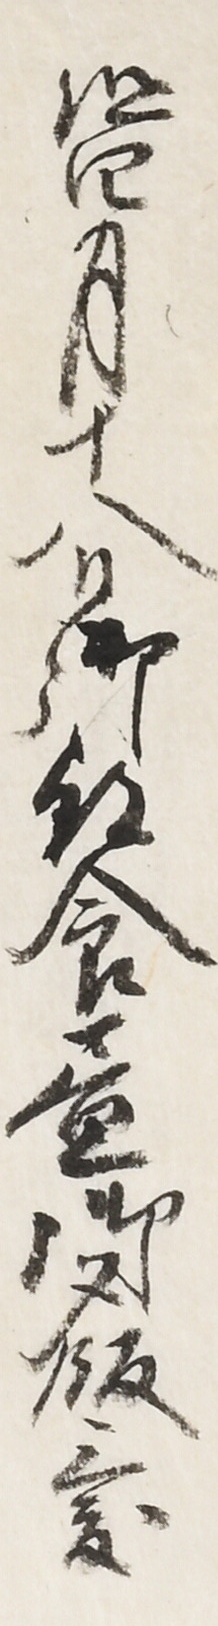但四月十八日御朝食昼御夕飯三度
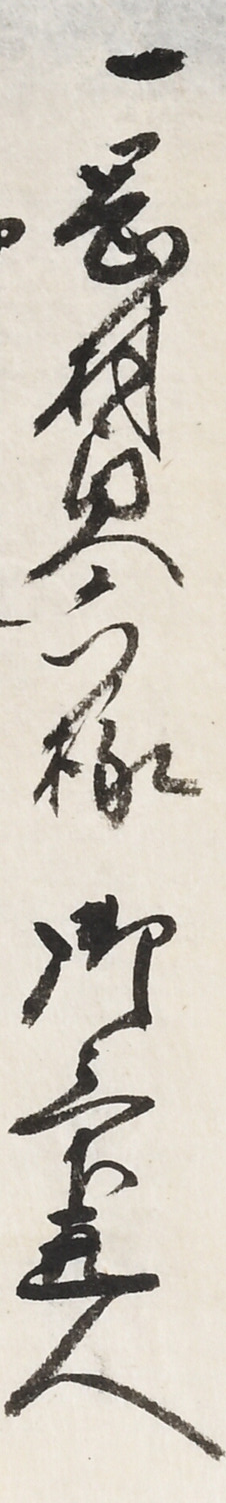一岡村貞六様御上下三人
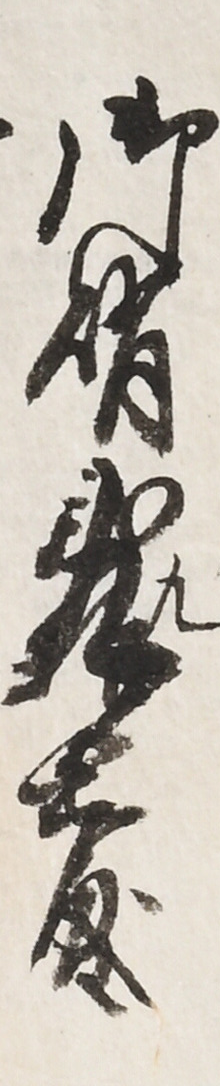御賄弐拾七度
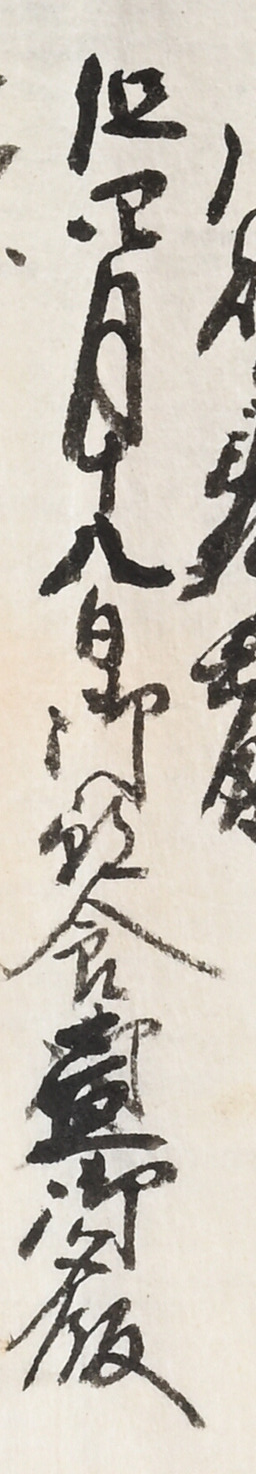但四度十八日御朝食昼御夕飯
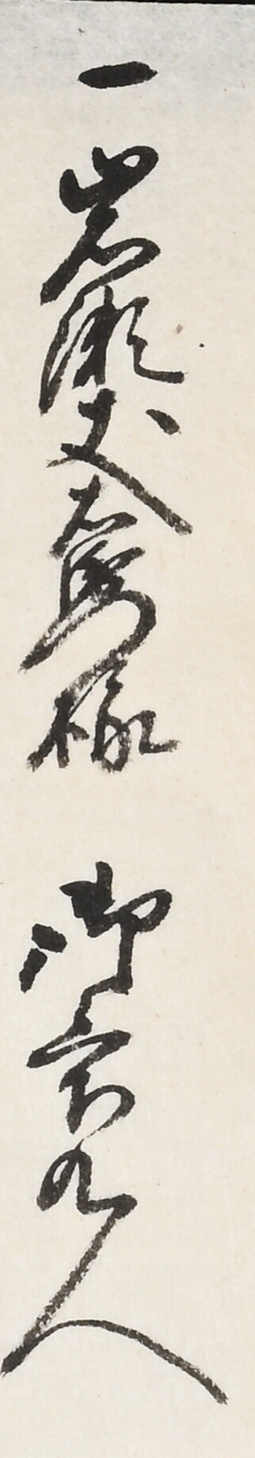一岩瀬丈右衛門様御上下九人
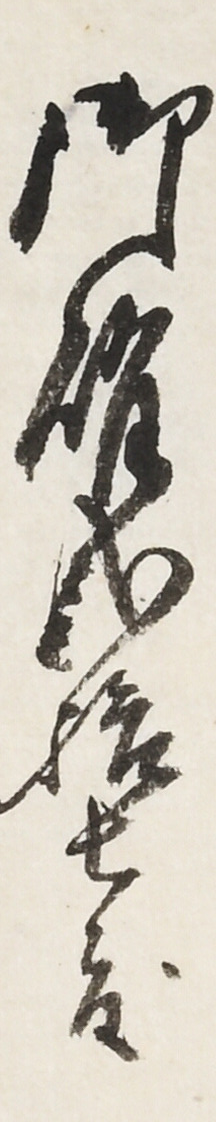御賄弐拾七度
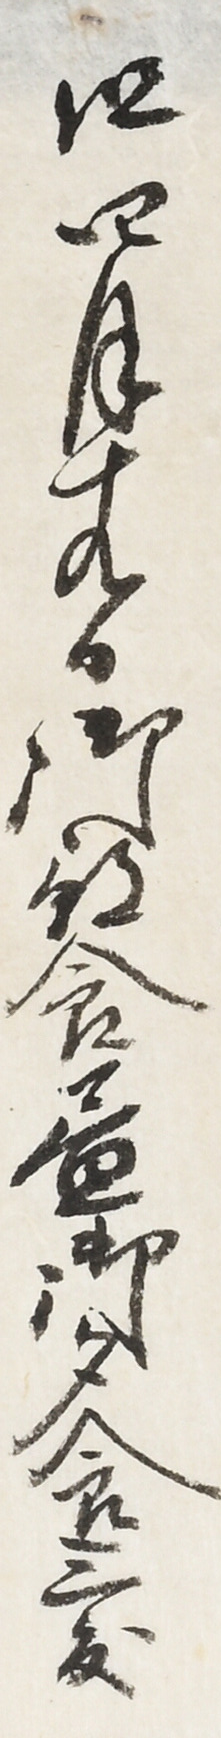但四月十九日御朝食昼御夕食三度
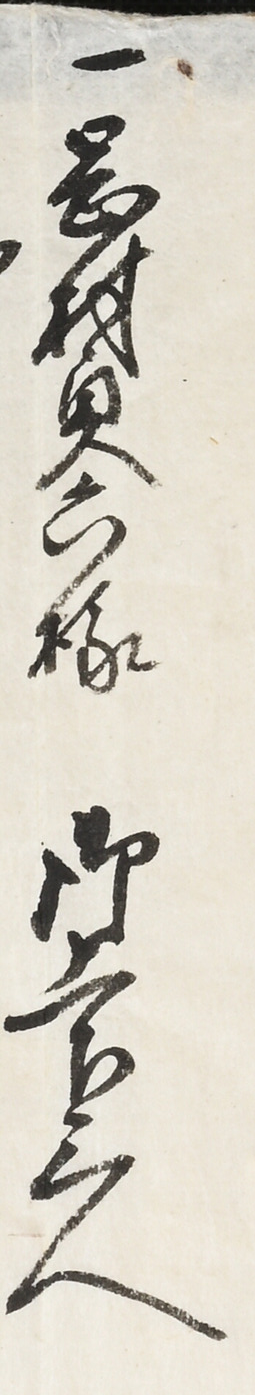一岡村貞六様御上下三人
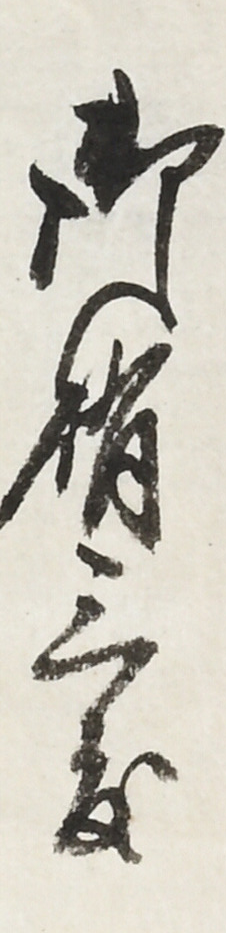御賄三度
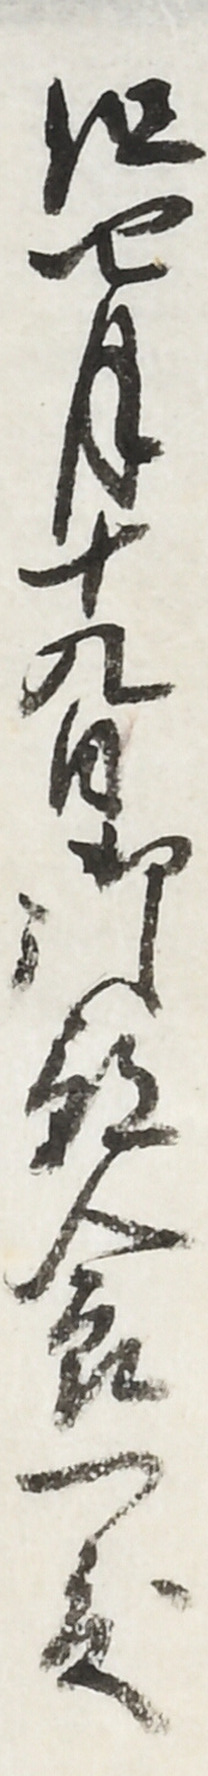但四月十九日御朝食一度
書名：御巡見様町方御泊相数書上覚
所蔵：伊那市立高遠町図書館・合同会社AMANE
